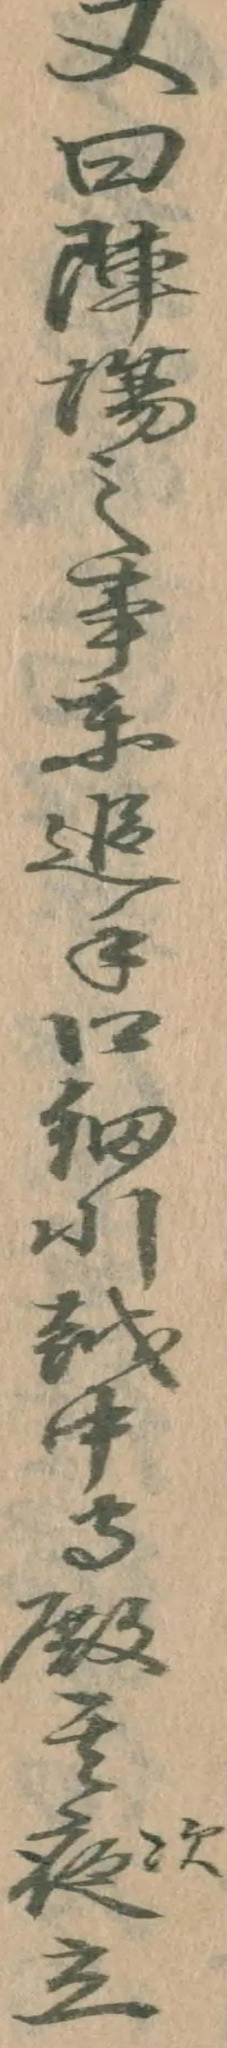又曰人馬之事未追手口細川越中守殿其夜立
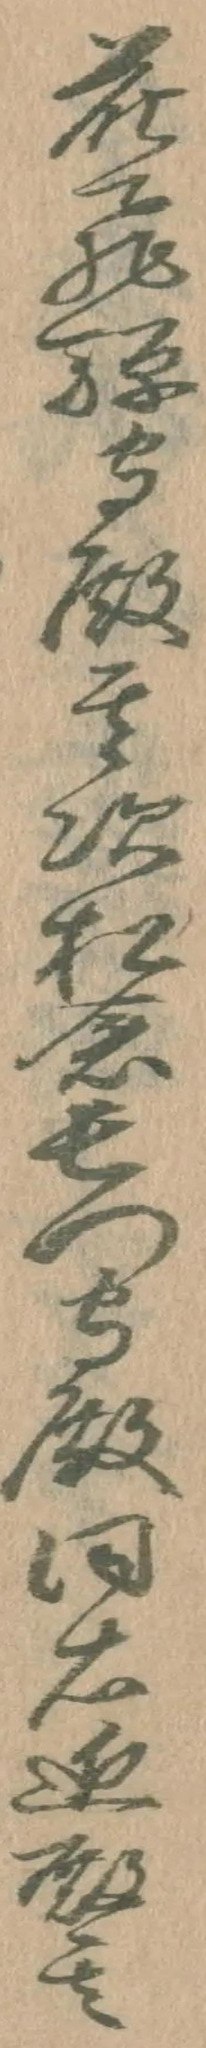花飛騨守殿其次松倉長門守殿同右近殿其
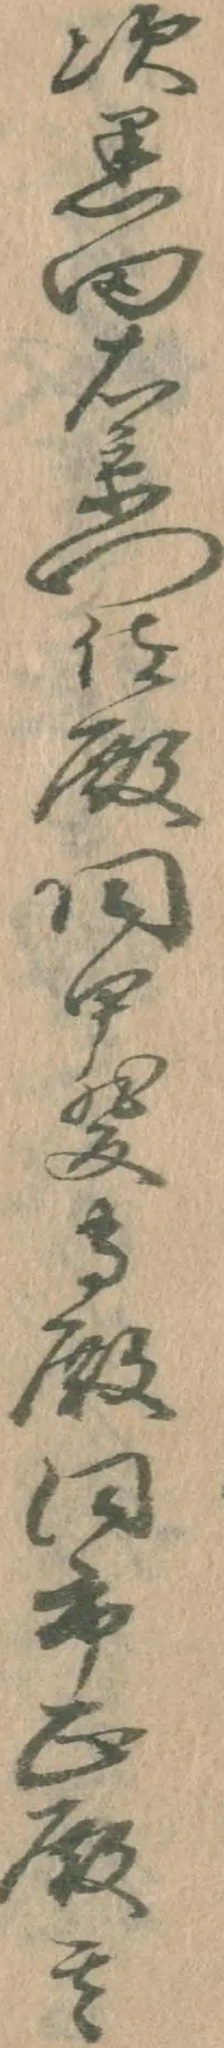次黒田右衛門佐殿同甲斐守殿同市正殿其
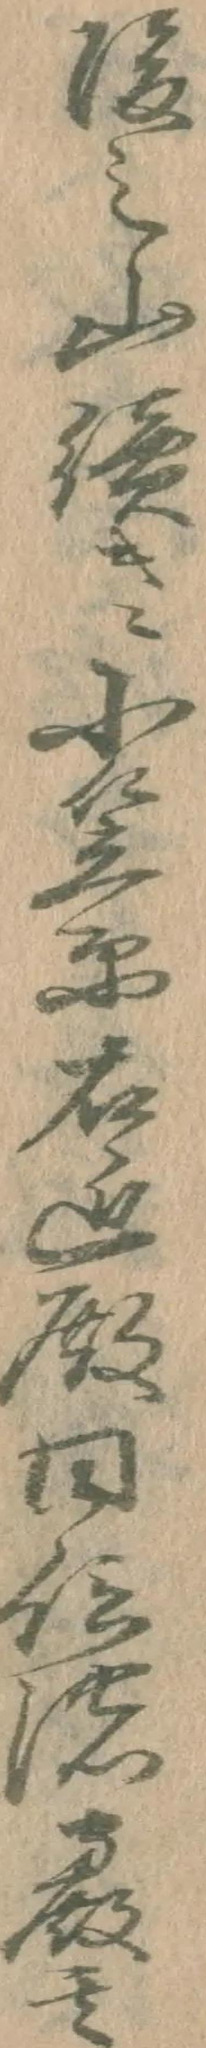後之山続きに小笠原右近殿同信濃守殿其
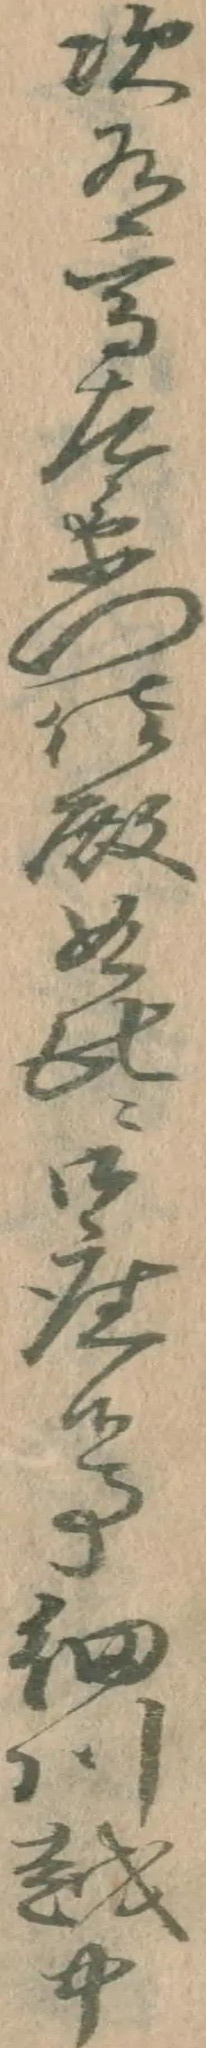次有馬左衛門佐殿如此に御座候事細川越中
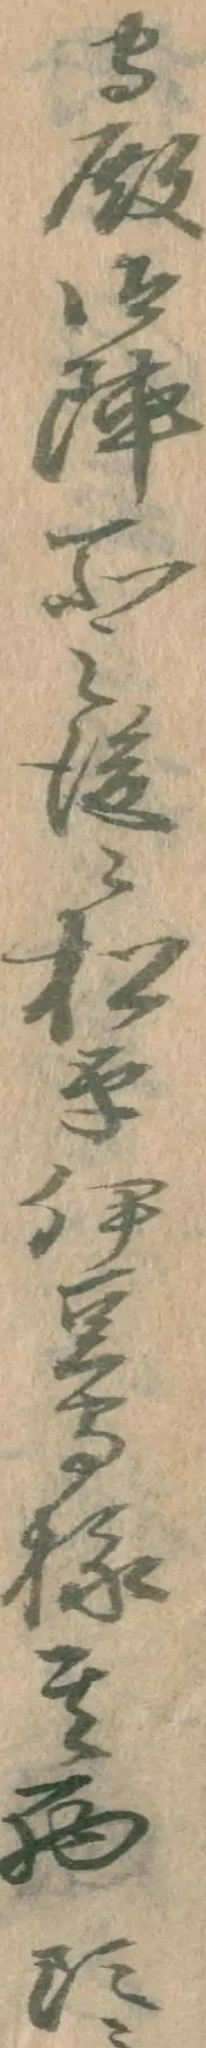守殿御陣所之後に松平伊豆守様其西頭に
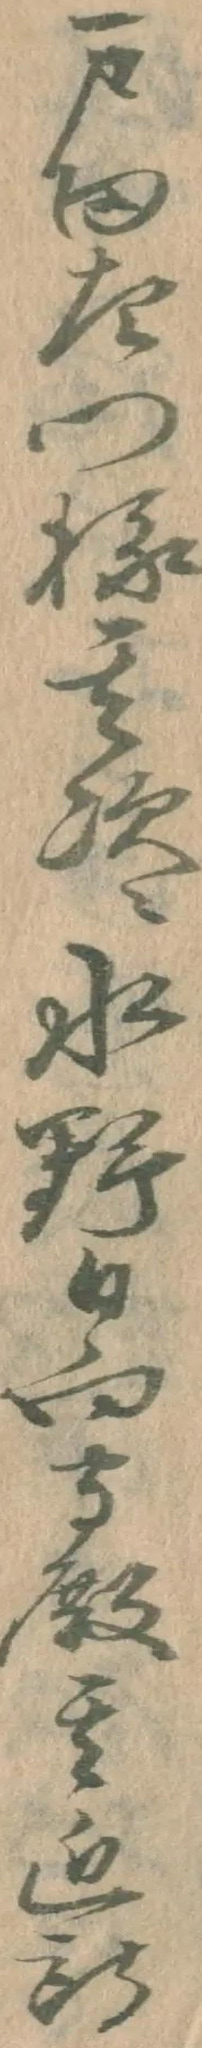戸田左門様其次に水野日向守殿其近所
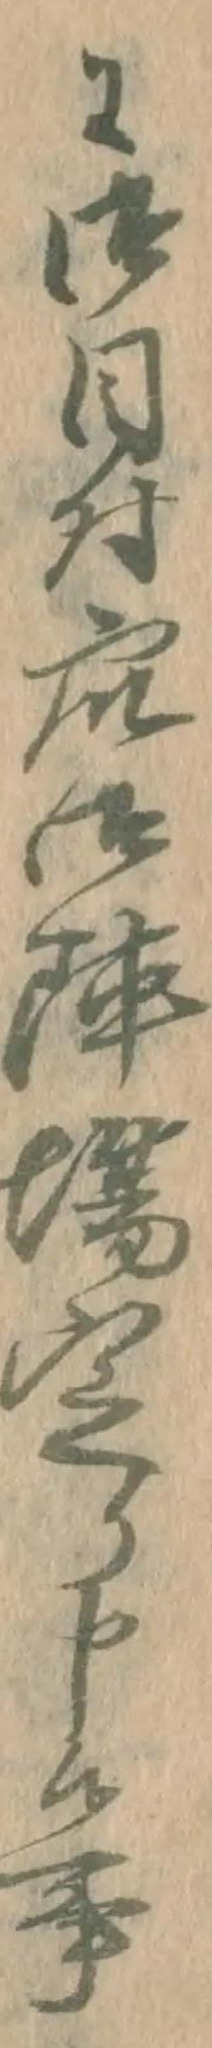尓御目付衆御陣場定り申候事
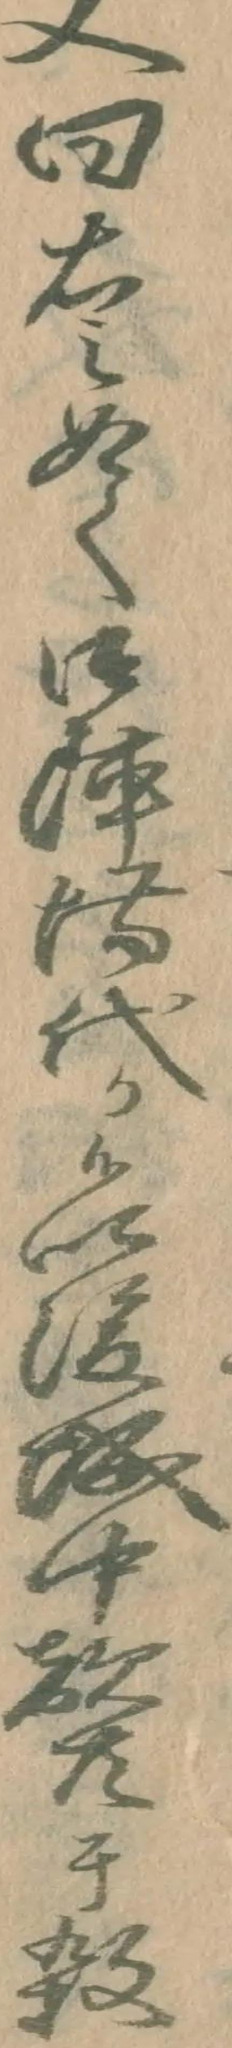又曰右之如く御陣場代り候以後城中敵共干殺

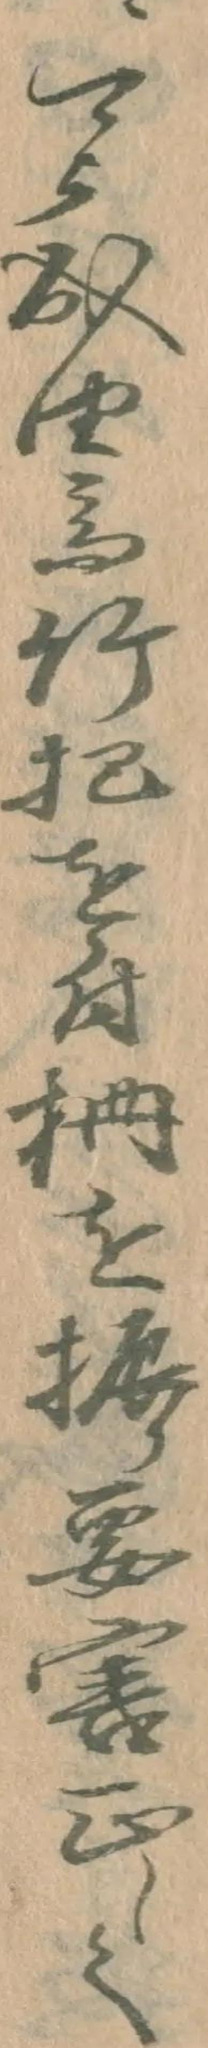に可被成由に而竹把を付柵を振り要害正して
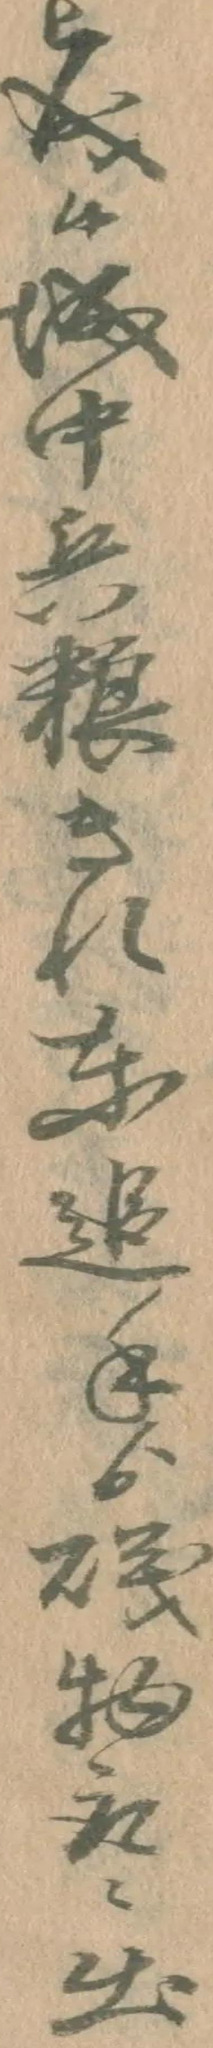被成候城中兵粮きれ東追手ゟ磯物取に出
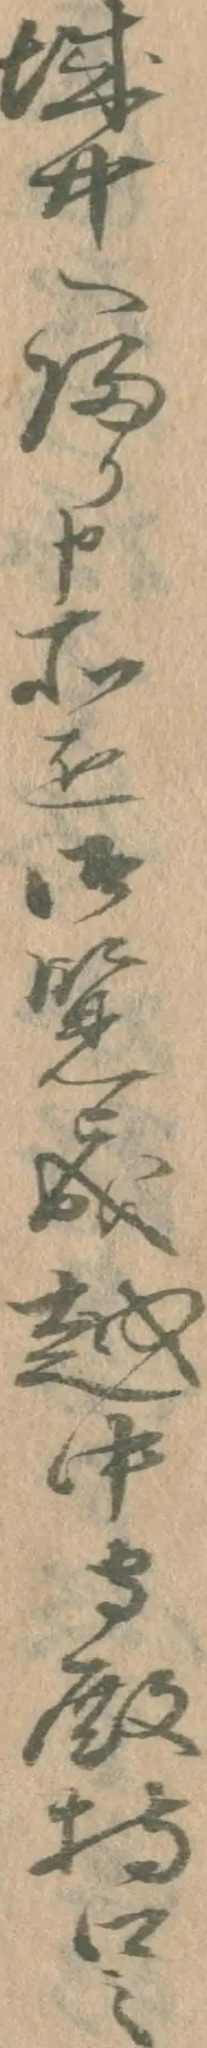城中へ帰り申所を御覧被成越中守殿持口之
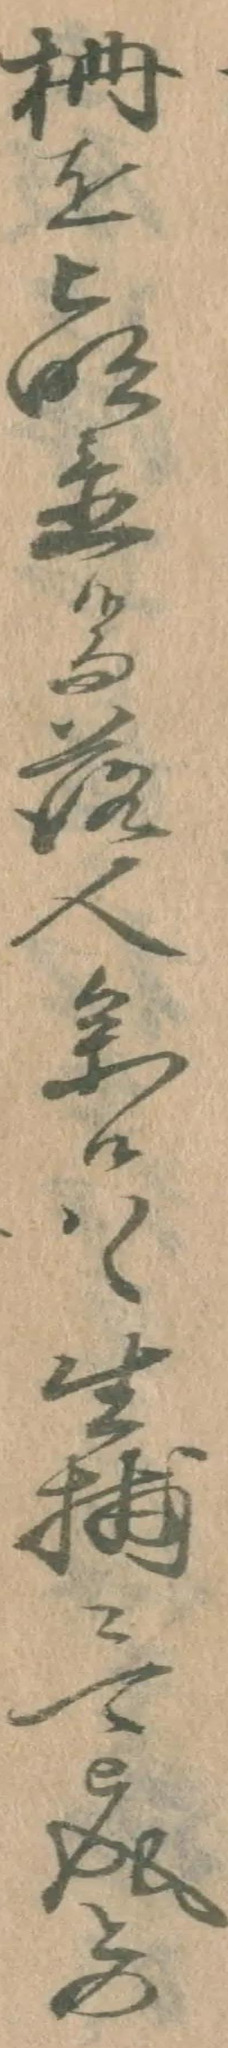柵を被明置候而落人参候はゝ生捕に可被成との
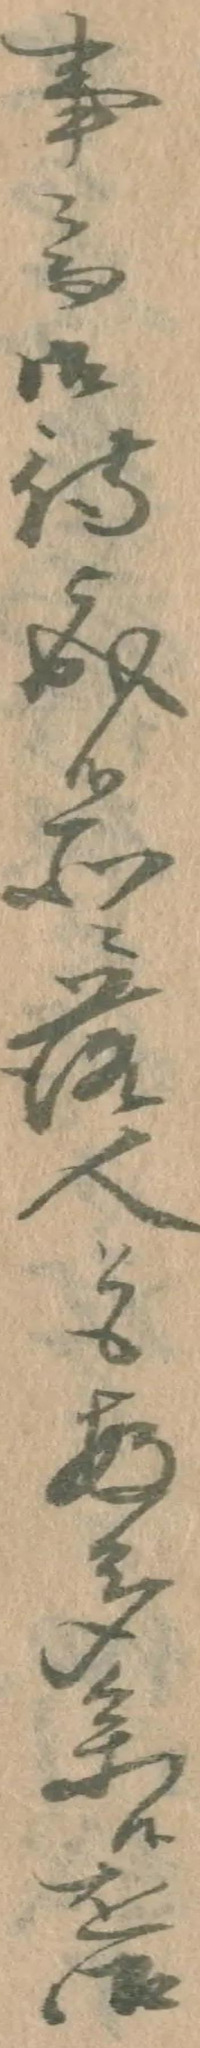事に而御待被成所に落人とも数多参候を御
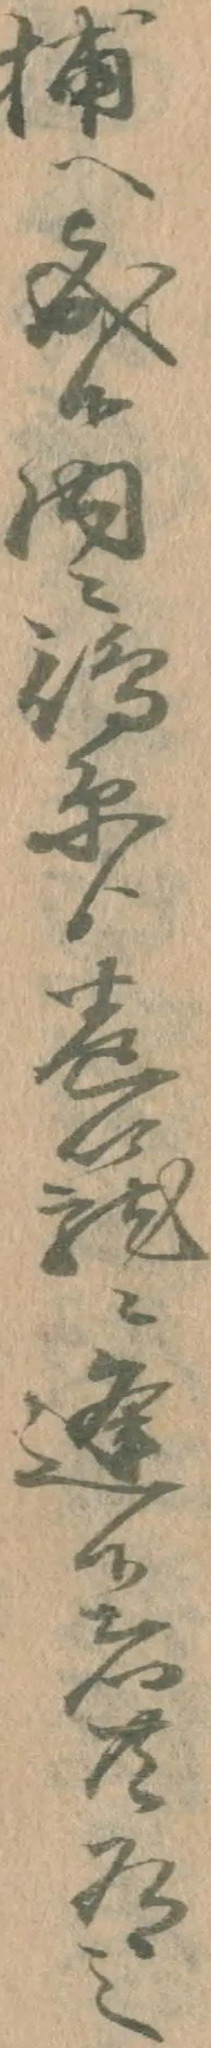捕へ被成候内に島原ゟ巻籠に会い逢候者共有之
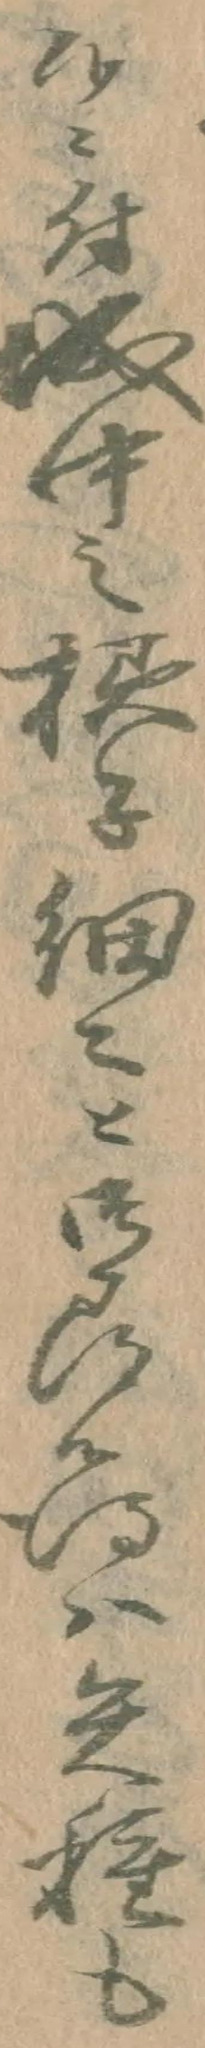候に付城中之様子細々と御尋候得は矢種も
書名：切支丹御退治記 49巻. [5]
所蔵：国立国会図書館 National Diet Library, JAPAN
